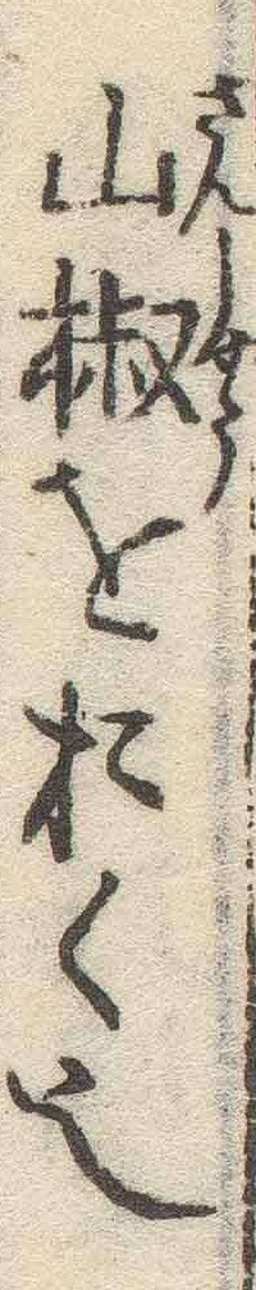山椒をおく也
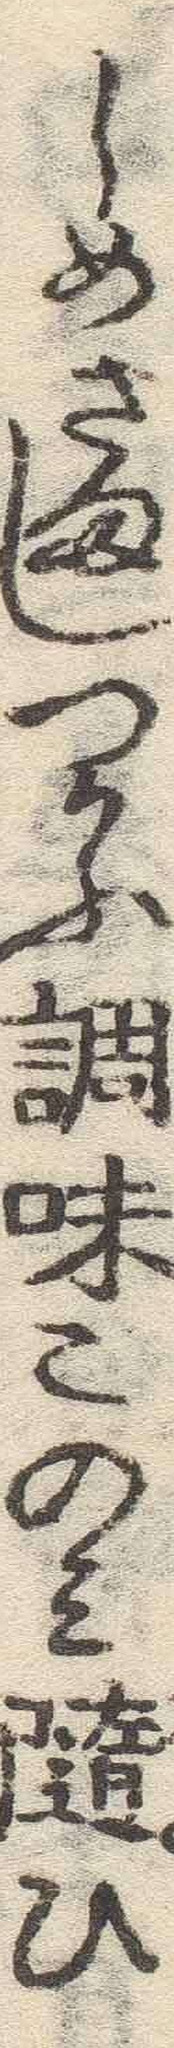しめさましつかふ調味このみ随ひ
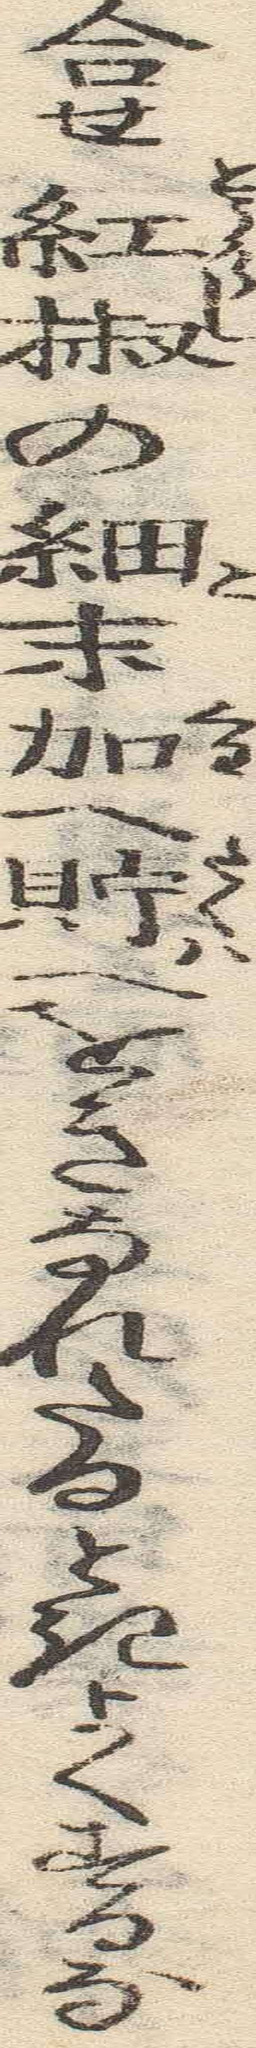合せ紅椒の細末加へ貯へをきなれたるときよくするな
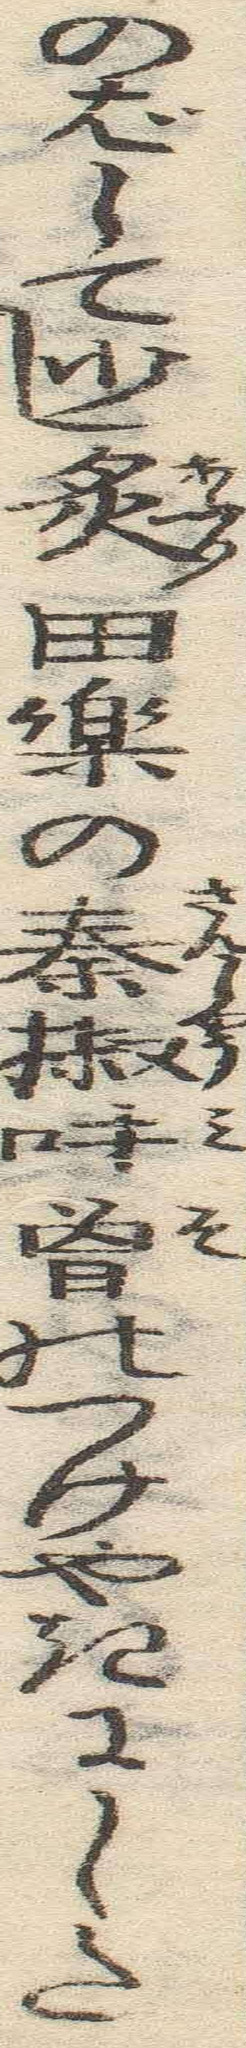のばして少し炙田楽の秦椒味曽のつけやきにした
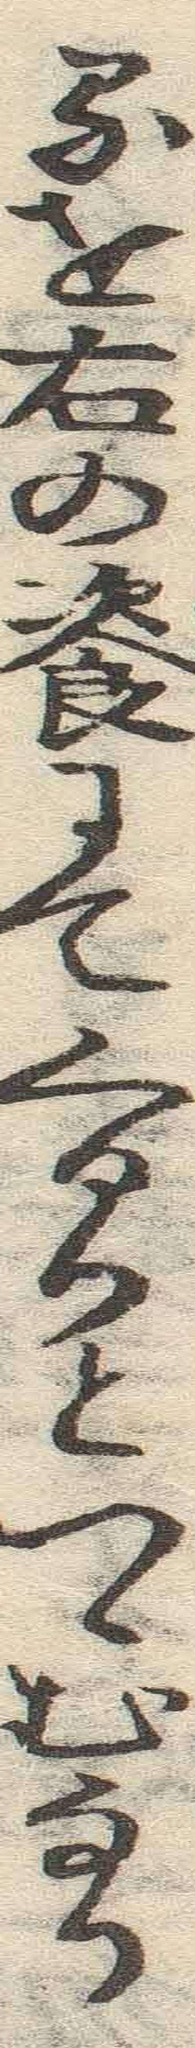るを右の餈にてくるりとつゝむなり
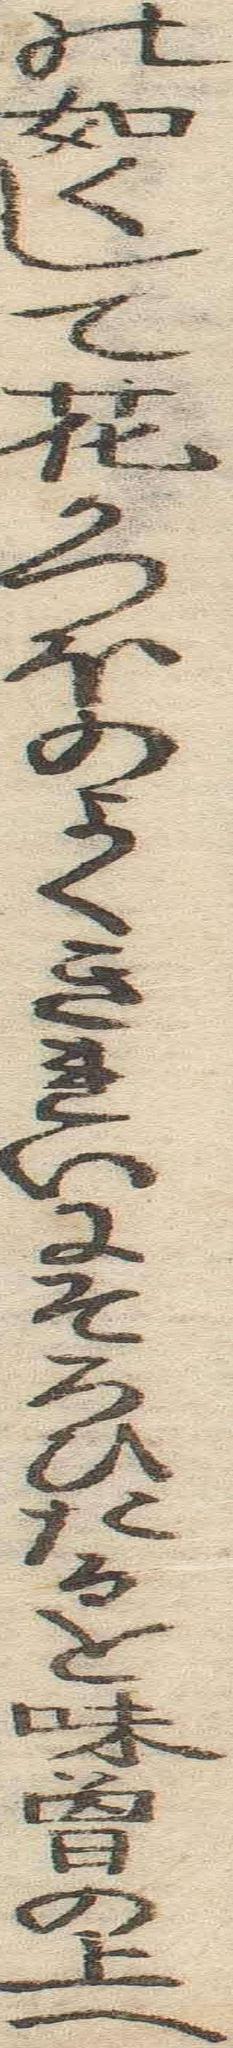の如くして花かつほのよくきれいにそろひたるを味曽の上へ

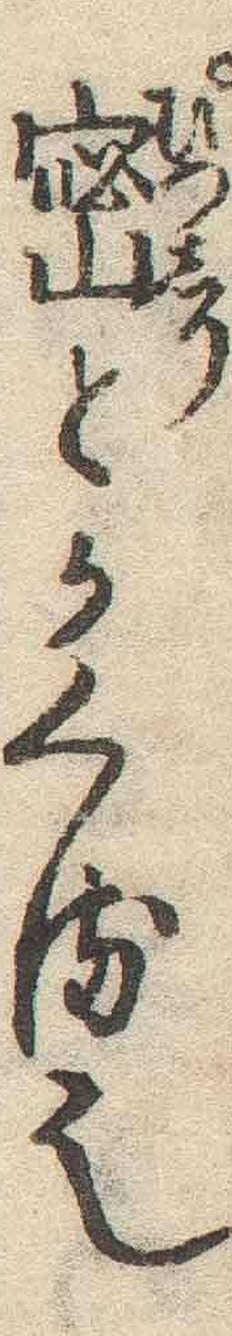密とかくる也
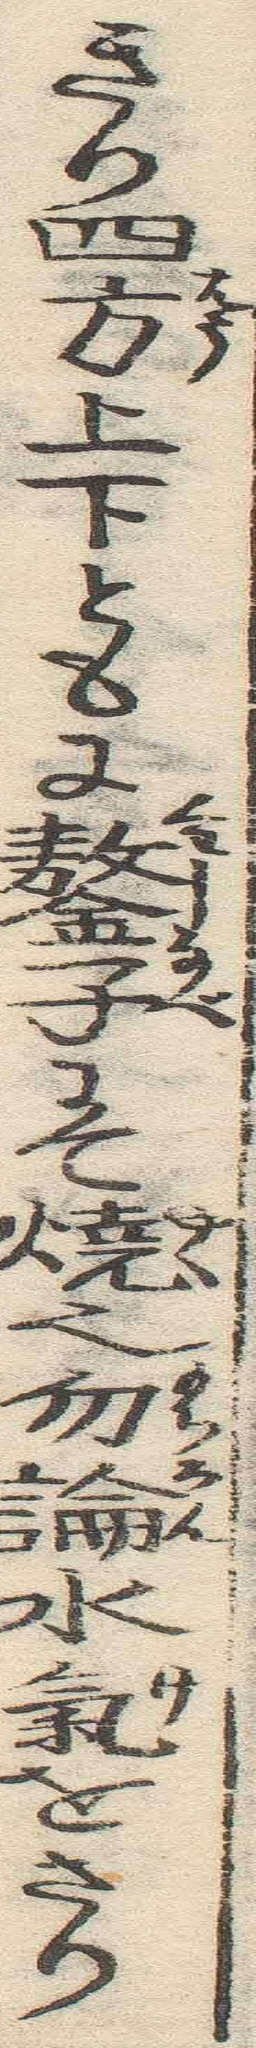きり四方上下とも鏊子にて焼也勿論水気をさり
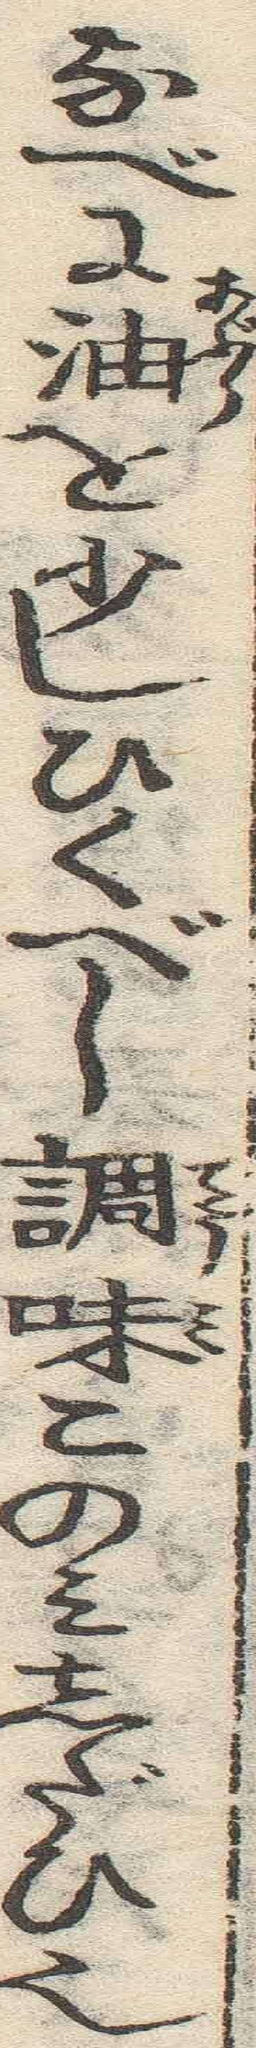なべに油を少しひくべし調味このみしだひ也
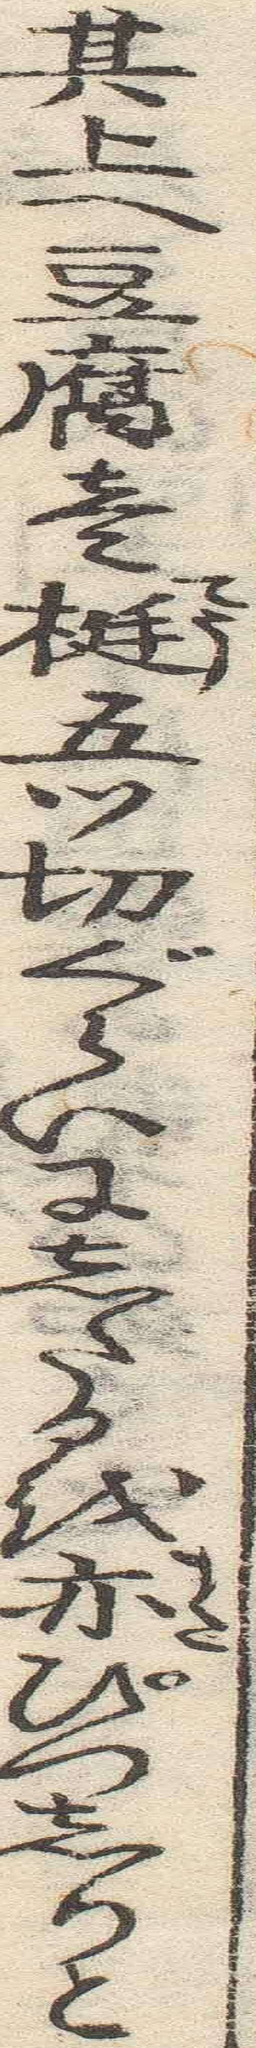其上へ豆腐壱挺五ツ切ぐらいにしたるを亦ぴつしりと
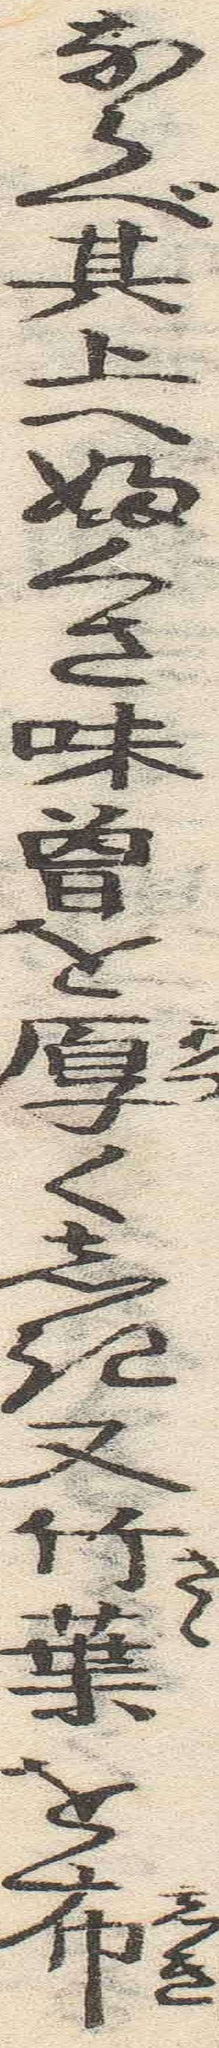ならべ其上へふくさ味曽を厚くしき又竹葉を布
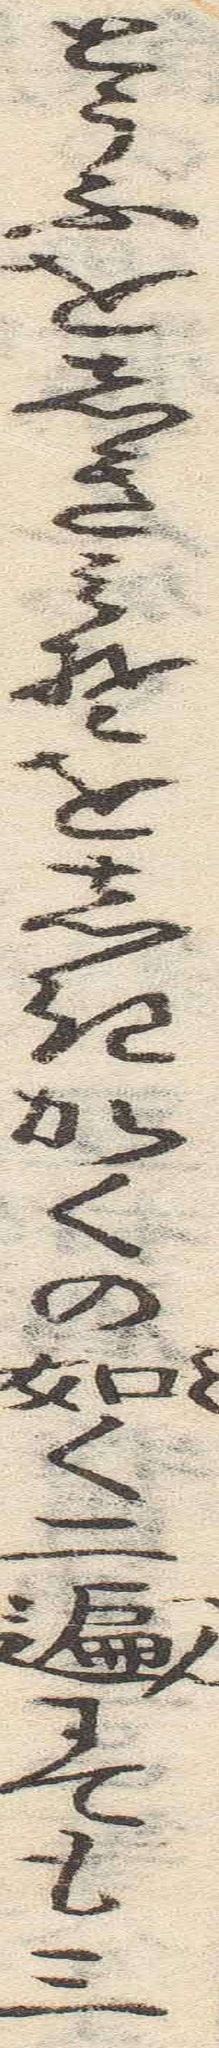とうふをしきみそをしきかくの如く二遍にても三
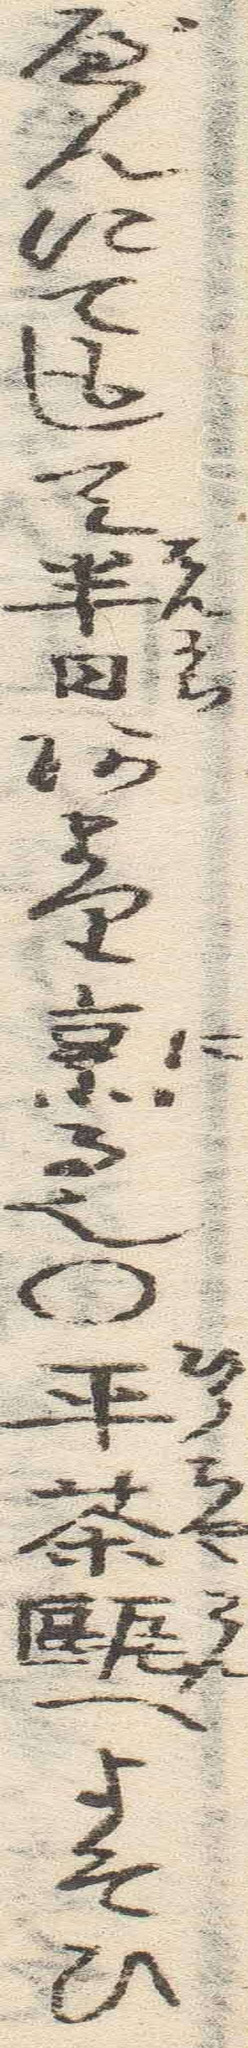べんにてもして半日あまり烹る也○平茶甌へよそひ
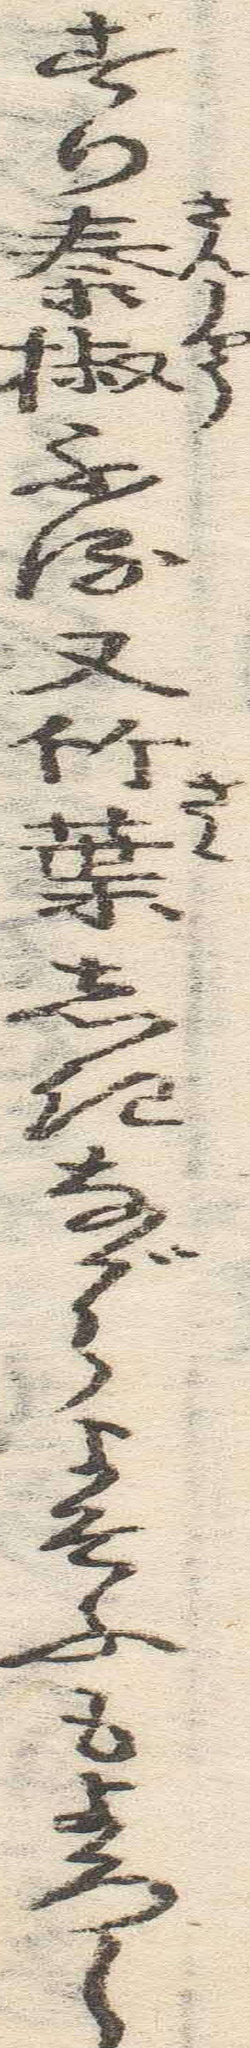すり秦椒ふる又竹葉しきながらよそふもよろし
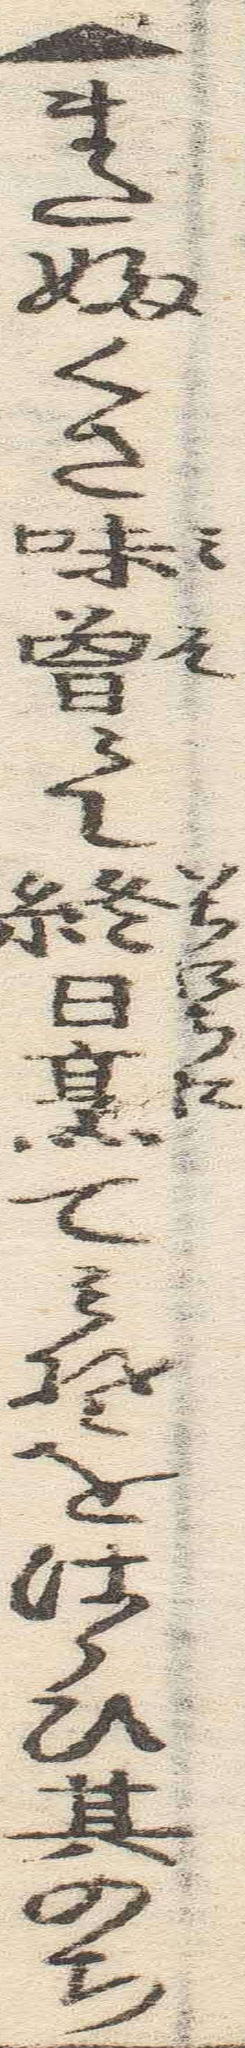▲またふくさ味曽にて終日烹てみそをはらひ其のち
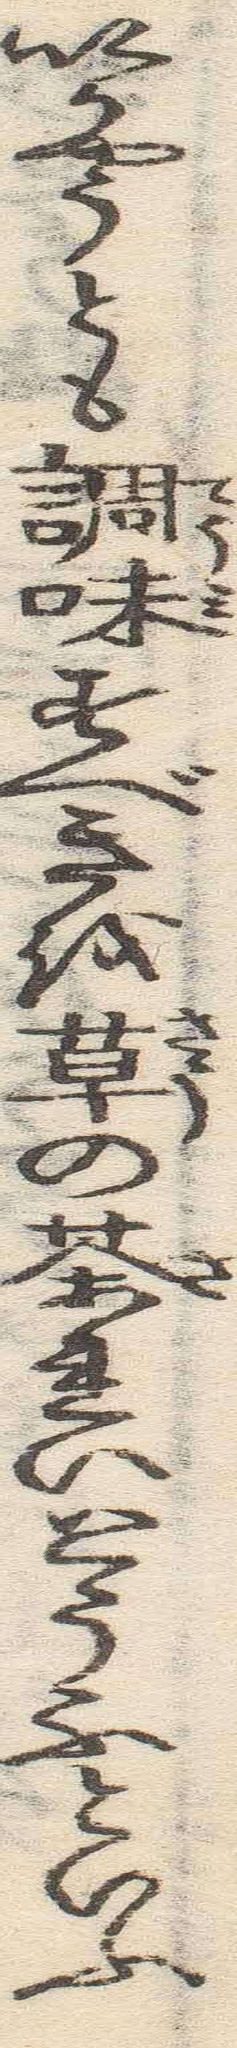いかやうとも調味すべきを草の茶れいとうふといふ
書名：豆腐百珍
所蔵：東京学芸大学附属図書館 国文学研究資料館
